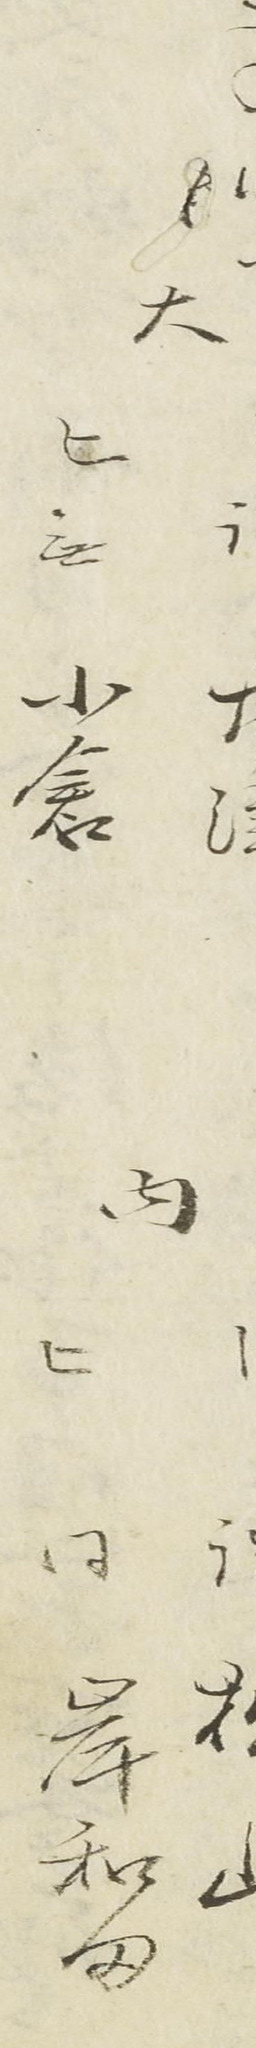ヒ無小倉ヒ同岸和田
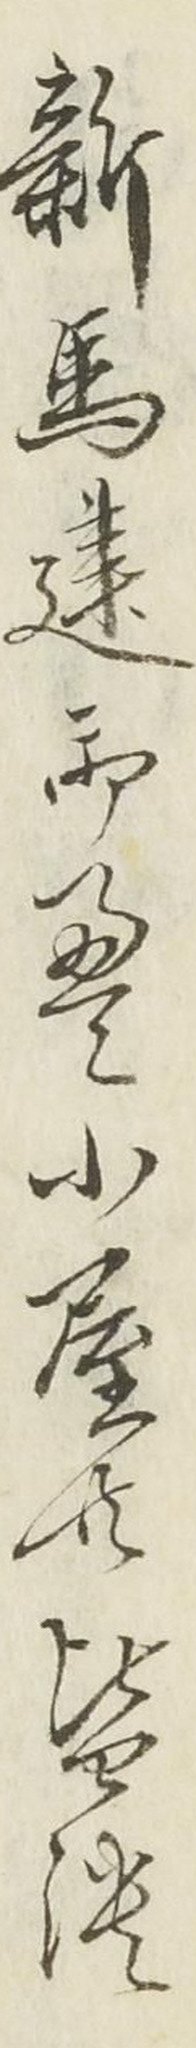新馬建御畳小屋共皆潰
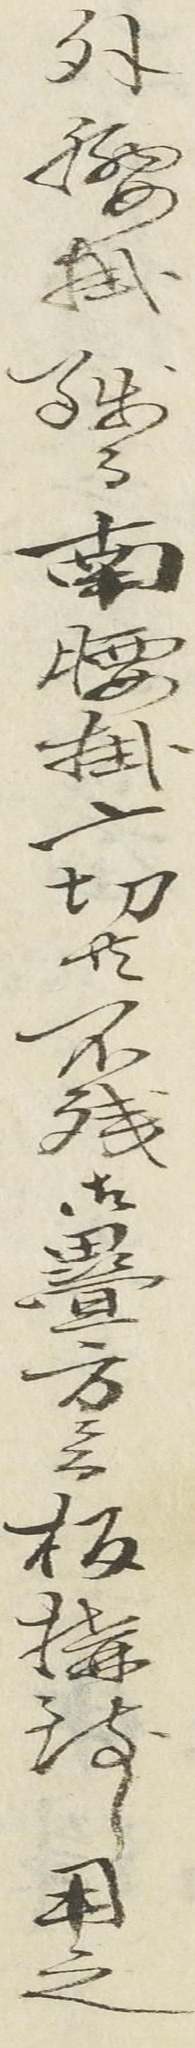外腰掛残る南腰掛〆切共不残御畳方ニ而板構致し用之
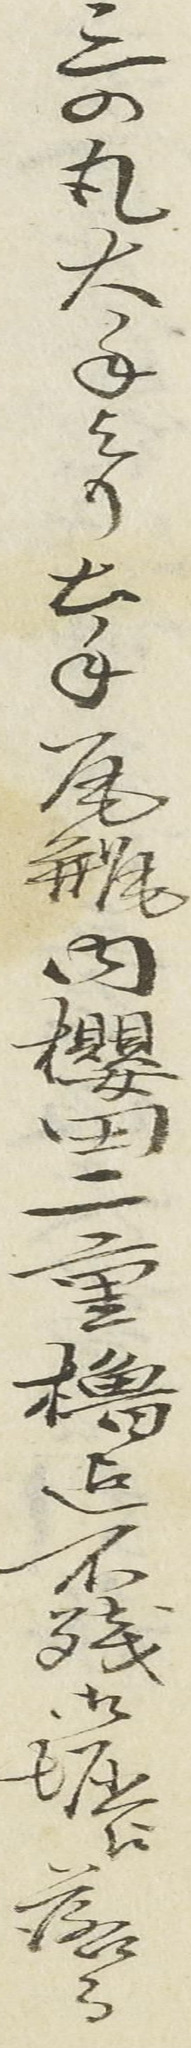三の丸大手より土手瓦瓶内桜田二重櫓迄不残御堀え落る
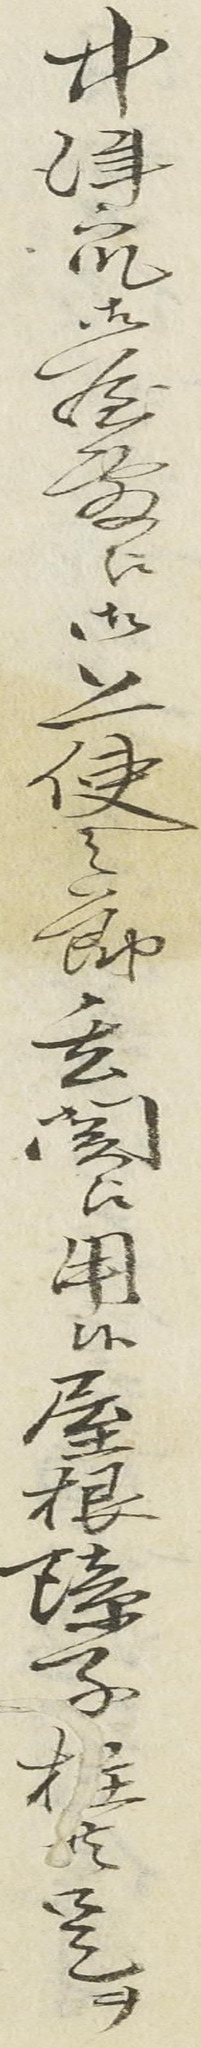中津衆御屋敷え御上使之節玄関え用候屋根障子柱共是ヲ
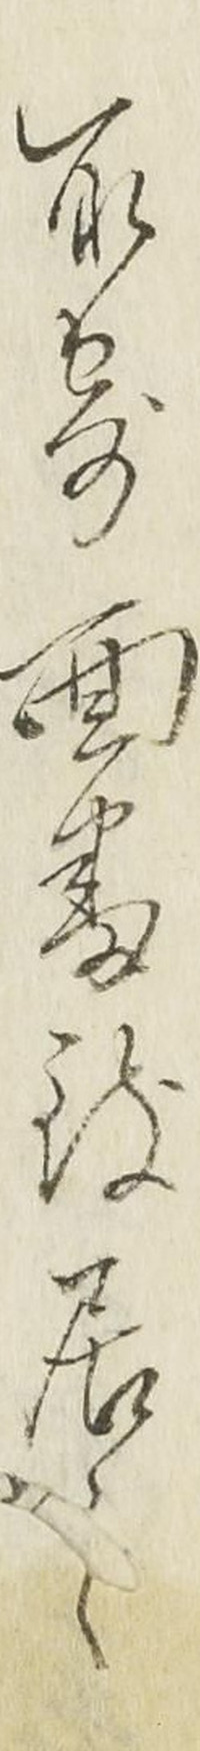取寄面番致居候
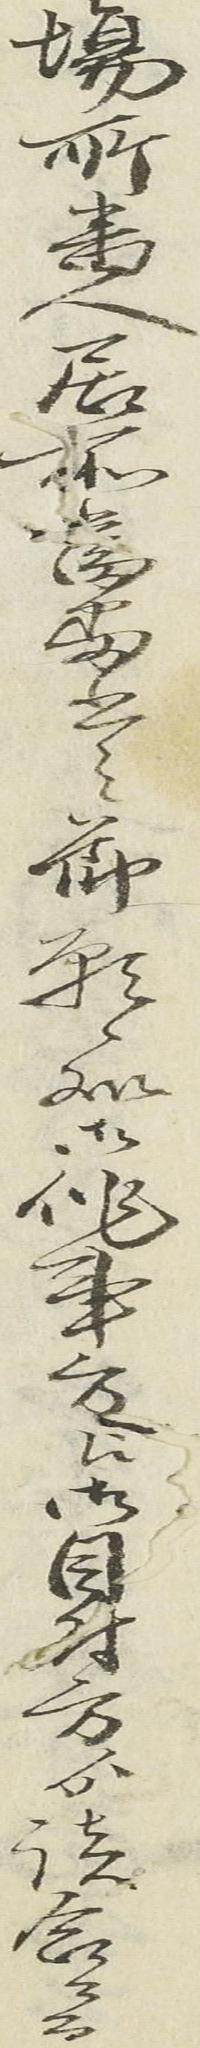場所番人居所当寄書之節願い候処御作事方え御目付方ゟ談合ニ而
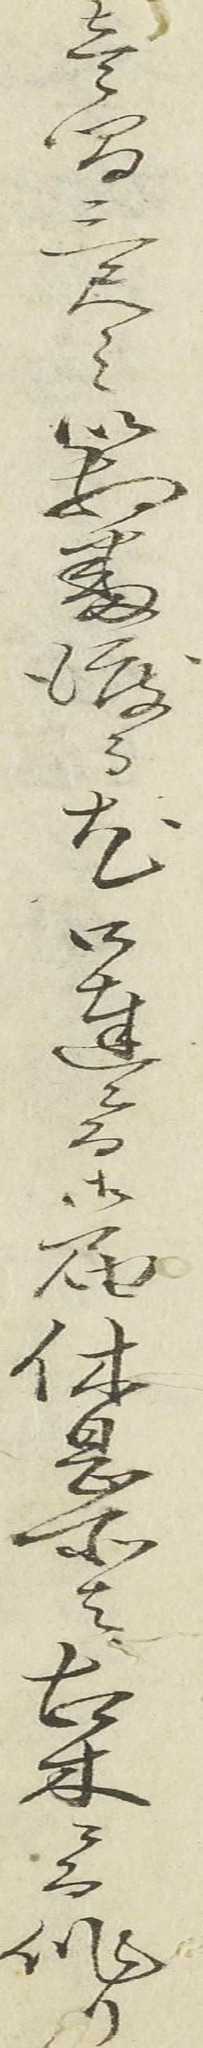壱間三尺之箱番渡る尤口達ニ而御届休息所は古木ニ而作り

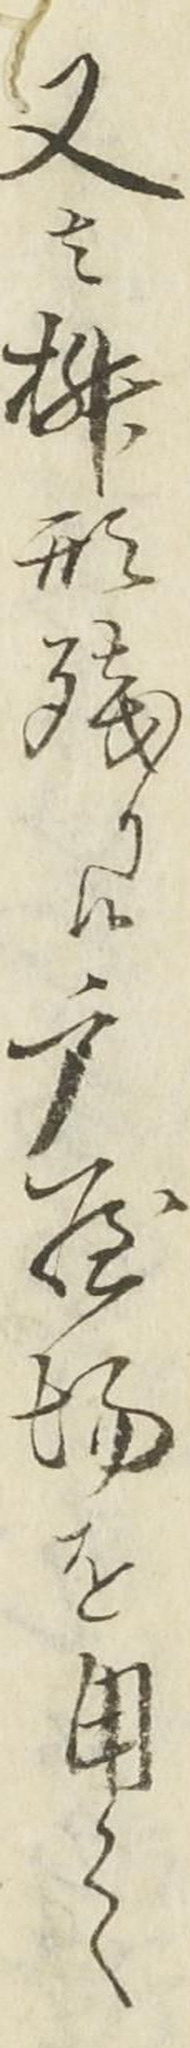又は桝形残り候戸屋場を用之
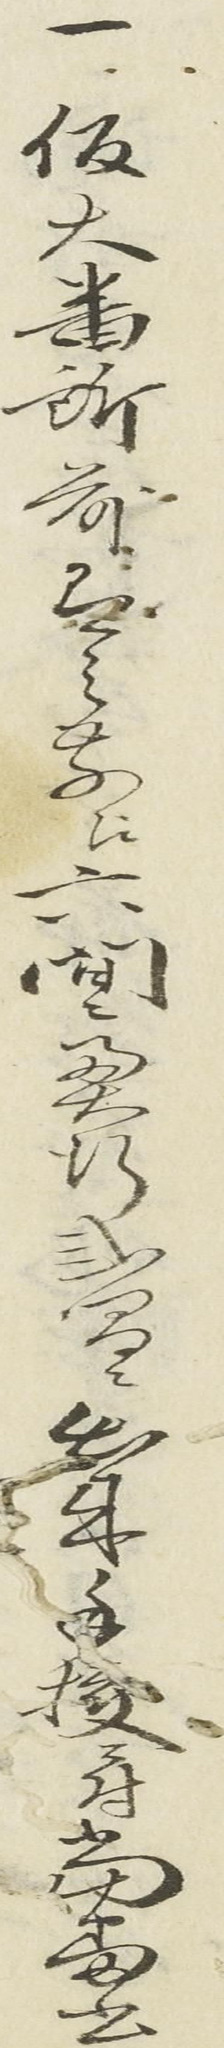一仮大番所前有之前え六間二奥行弐間二出来手狭二付当番書
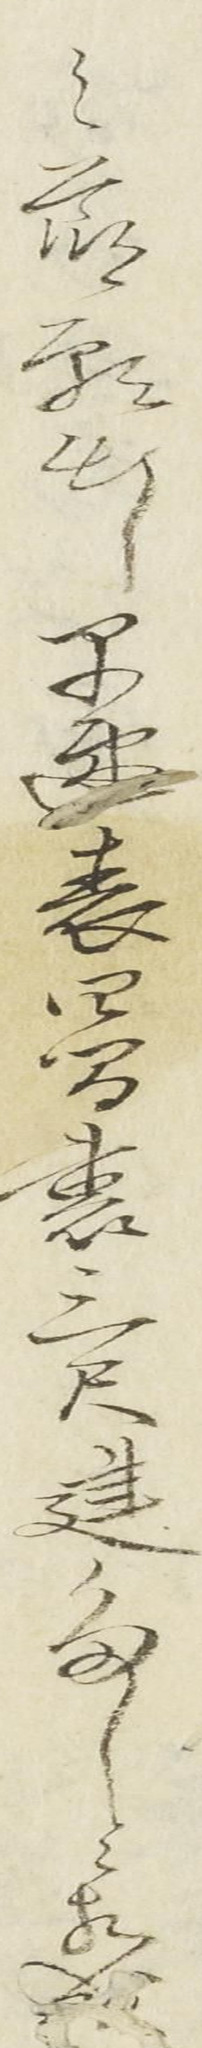之節願出し早速表四間裏三尺建たし二相成
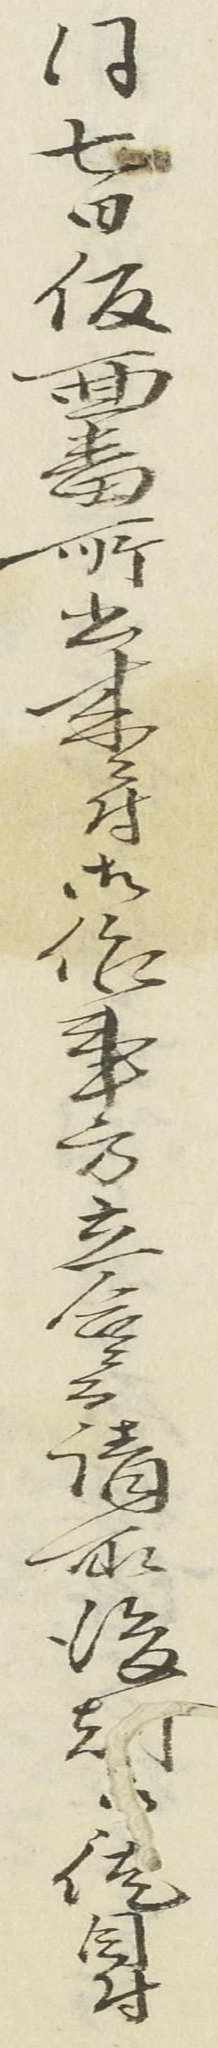同七日仮面番所出来二付御作事方立合二而請取後刻御徒目付
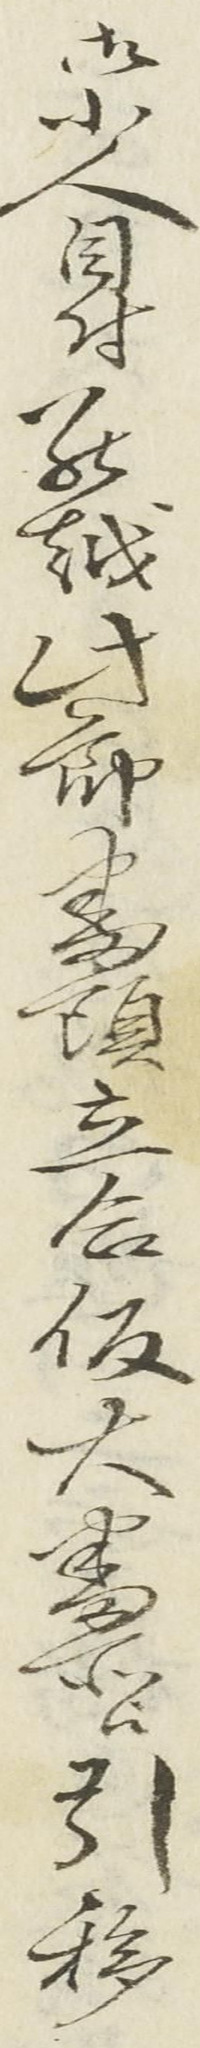御小人目付罷越此節番頭立合仮大番所え引移
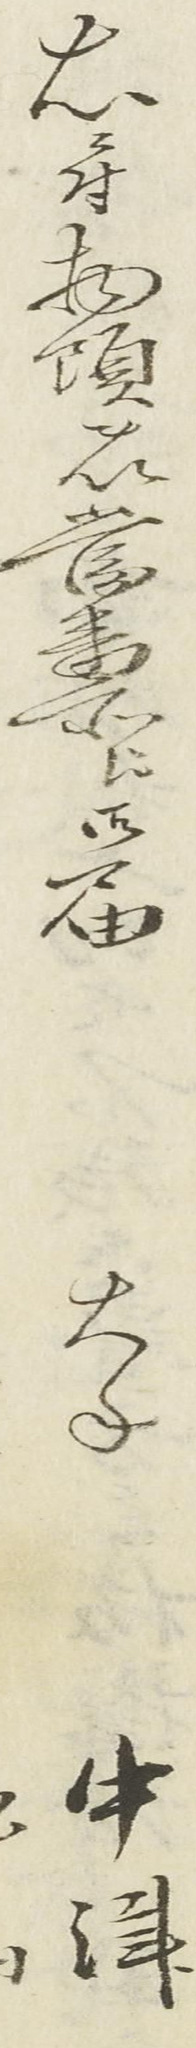右ニ付物頭を以当番所え御届大手中津
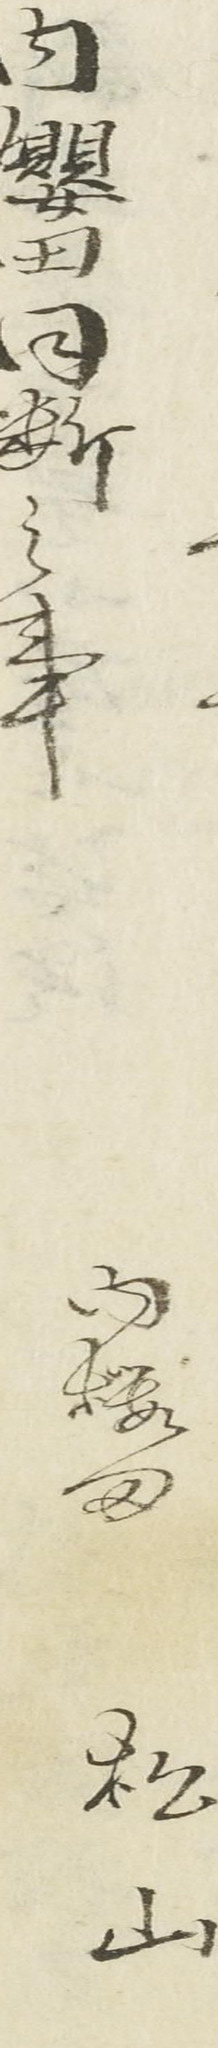内桜田同断之事内桜田松山
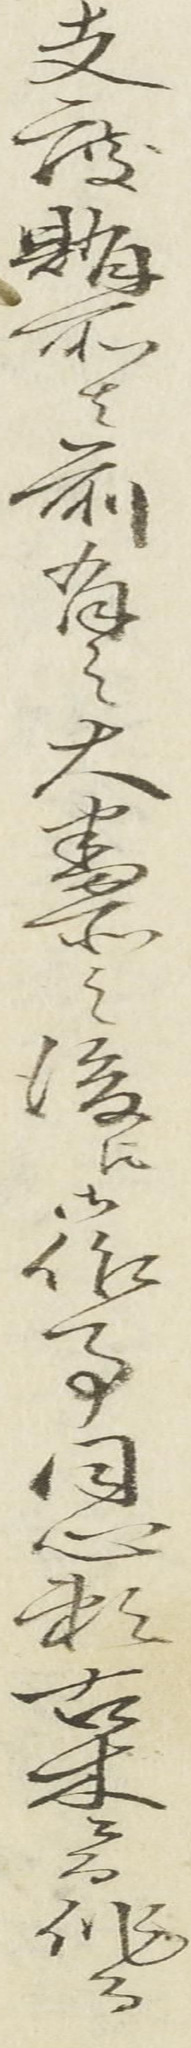支度賄所は前有之大番所之後え御作事同心頼古木ニ而作る
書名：安政二乙卯年十月二日大地震之事
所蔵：東京大学地震研究所図書室 Earthquake Research Institute Library, The University of Tokyo, JAPAN
